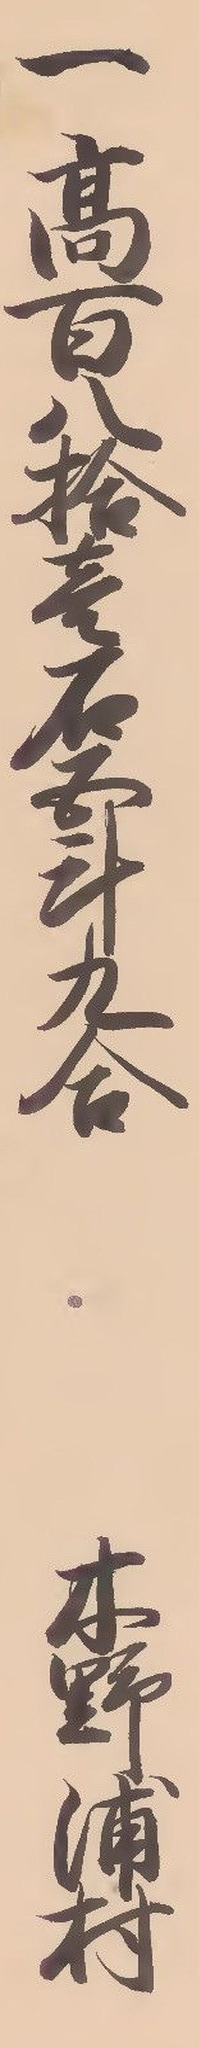一高百八拾壱石五斗九合木野浦村

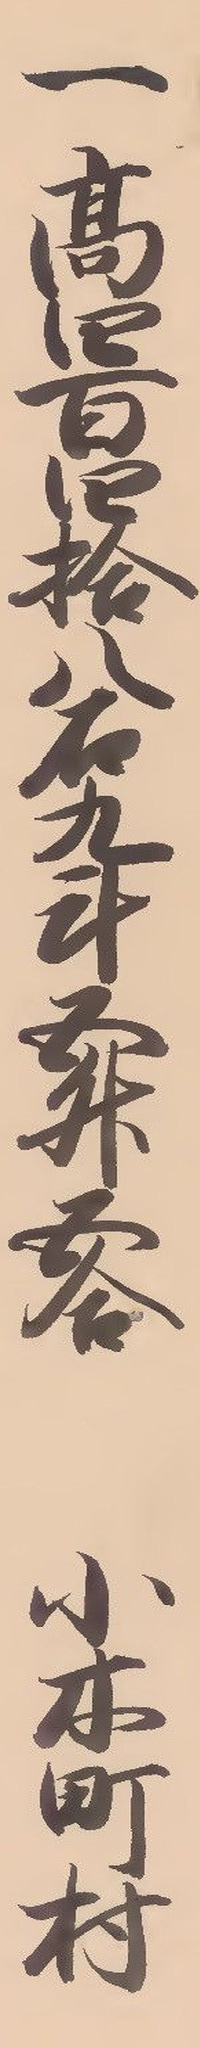一高四百四拾八石九斗五升五合小木町村
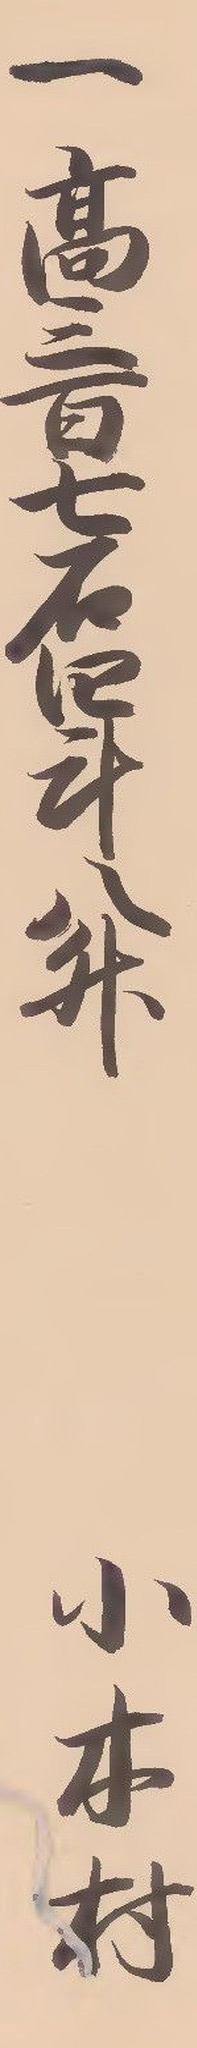一高三百七石四斗八升小木村
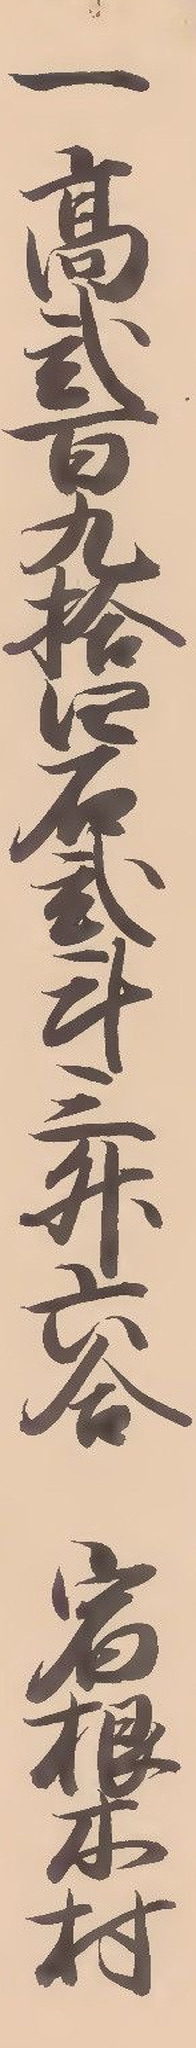一高弐百九拾四石弐斗三升六合宿根木村
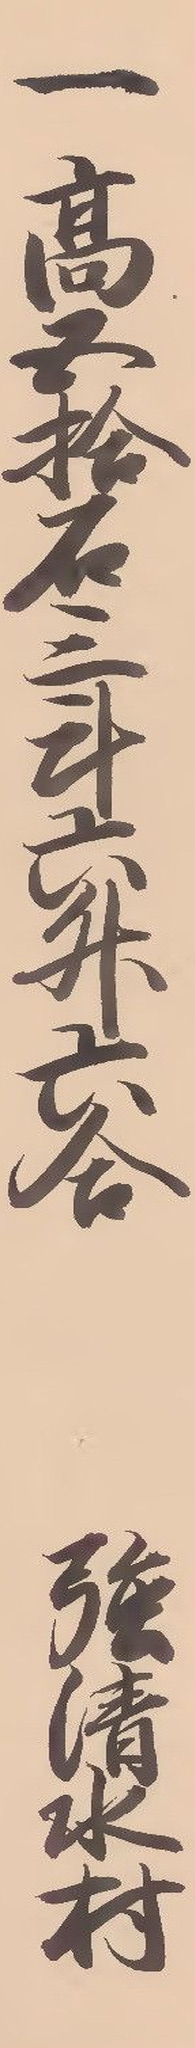一高五拾石三斗六升六合強清水村
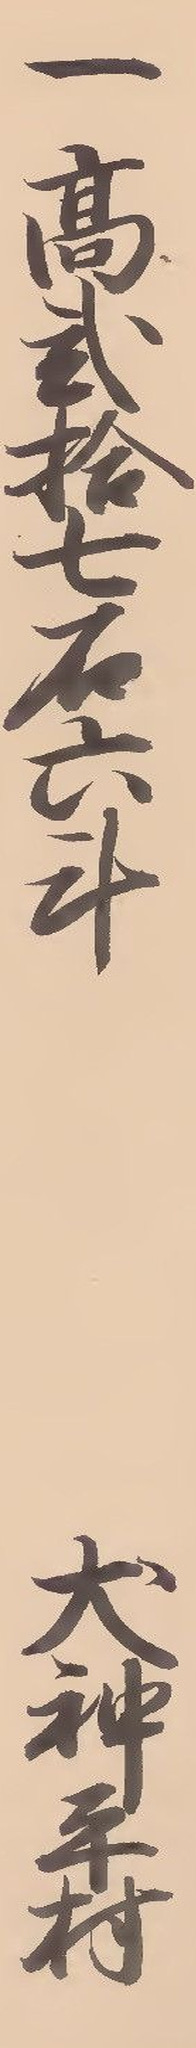一高弐拾七石六斗犬神平村
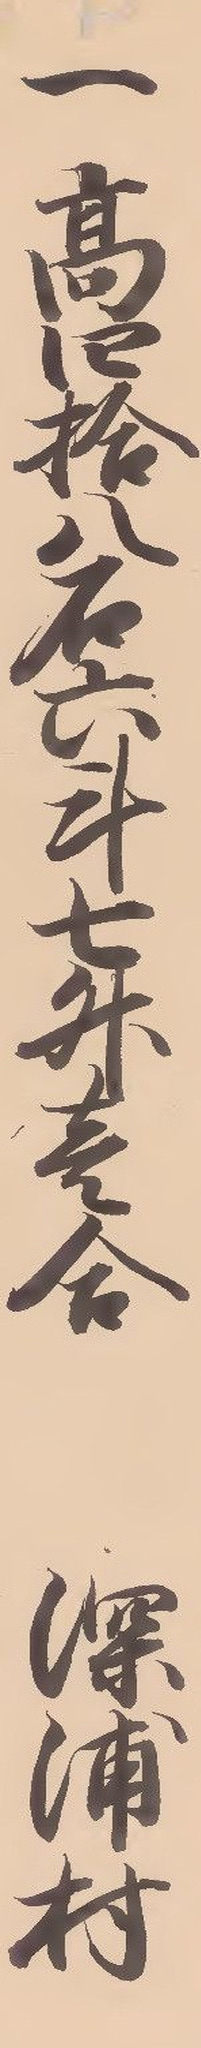一高四拾八石六斗七升壱合深浦村
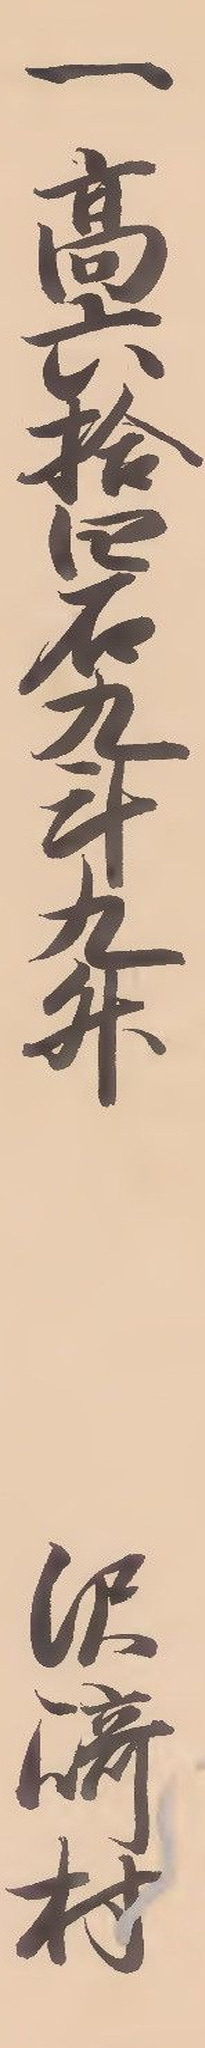一高六拾四石九斗九升沢崎村
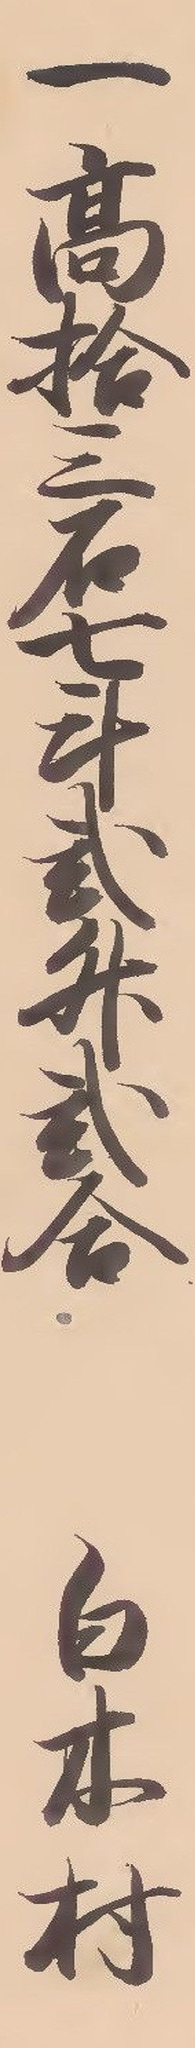一高拾三石七斗弐升弐合白木村

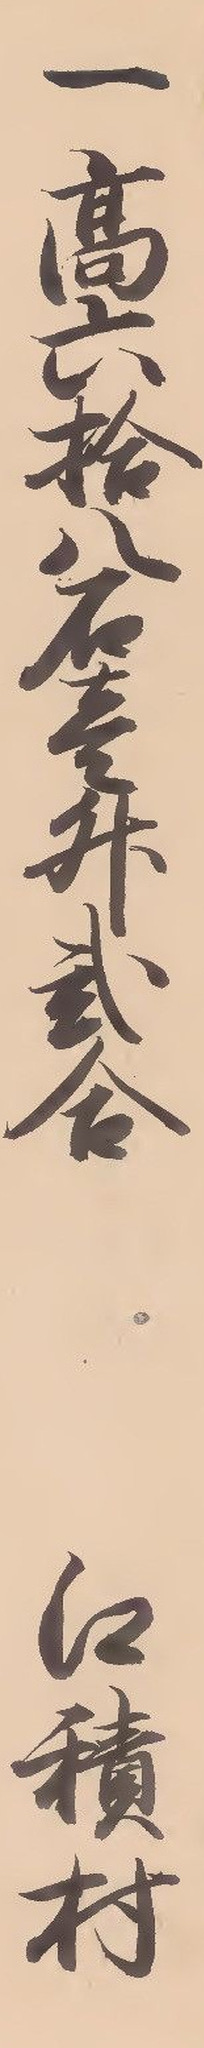一高六拾八石壱升弐合江積村
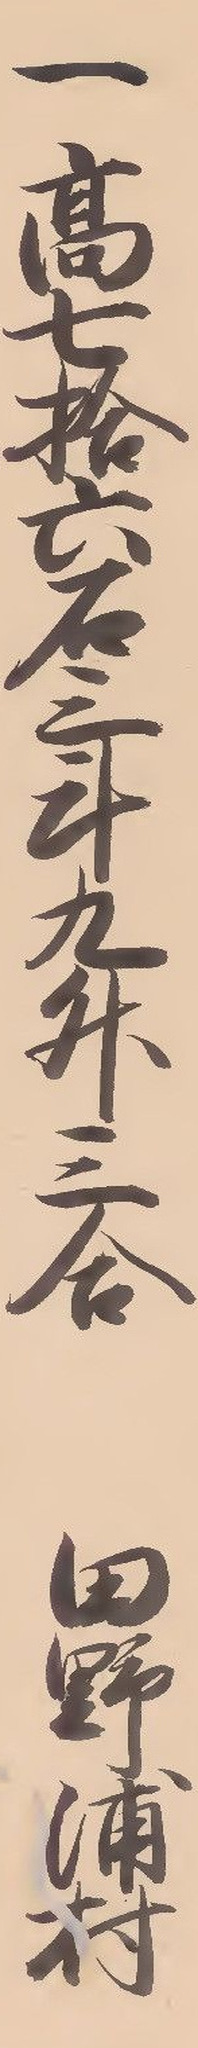一高七拾六石三斗九升三合田野浦村
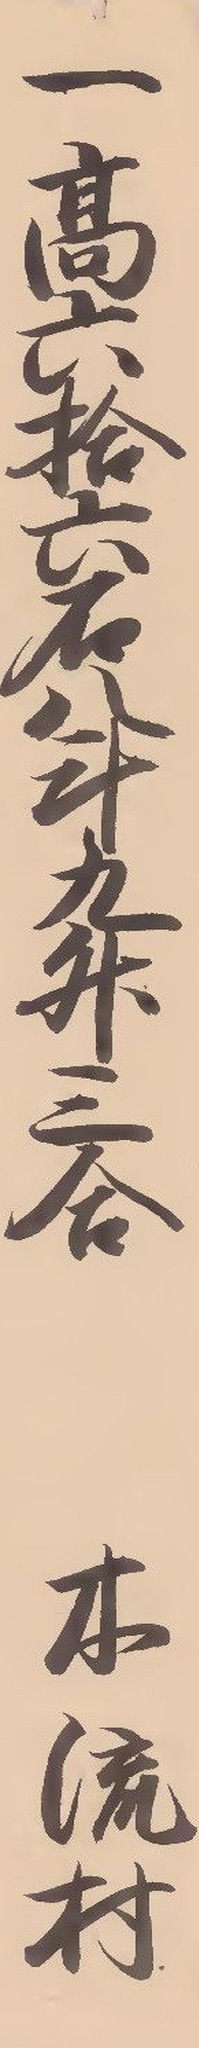一高六拾六石八斗九升三合木流村
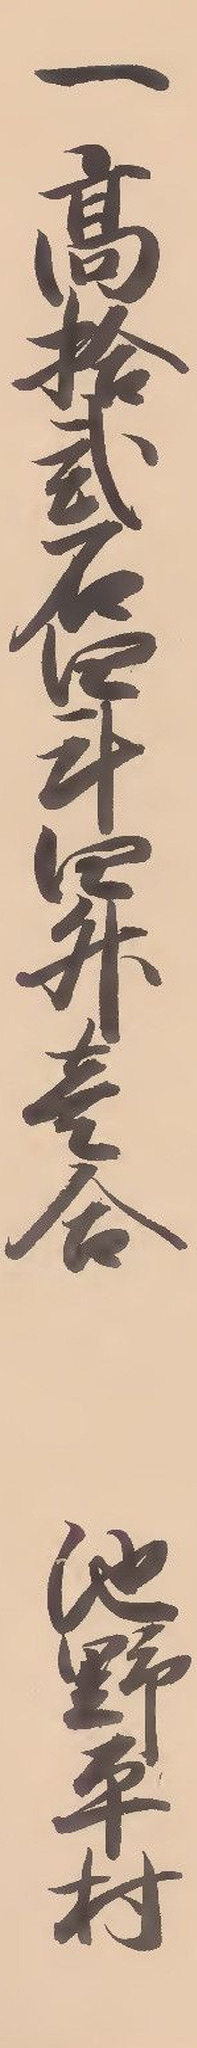一高拾弐石四斗四升壱合池野平村
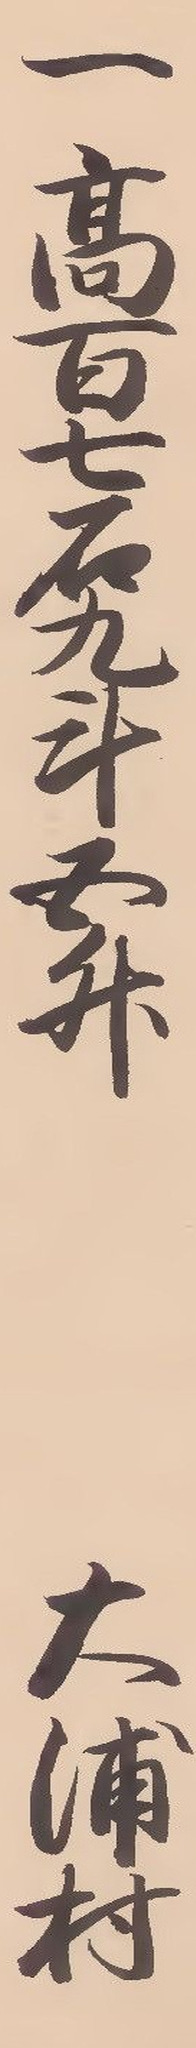一高百七石九斗五升大浦村
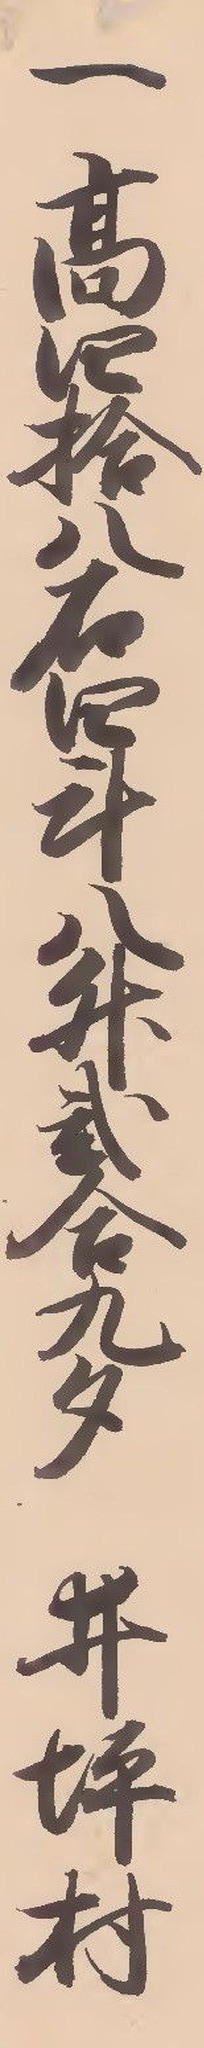一高四拾八石四斗八升弐合九勺井坪村
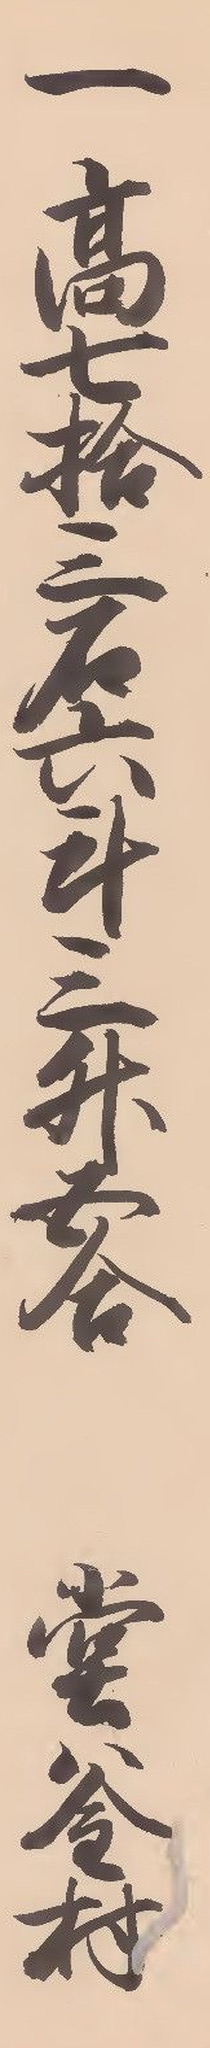一高七拾三石六斗三升五合堂釜村
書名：佐渡国郷帳
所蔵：国立公文書館 National Archives of Japan
